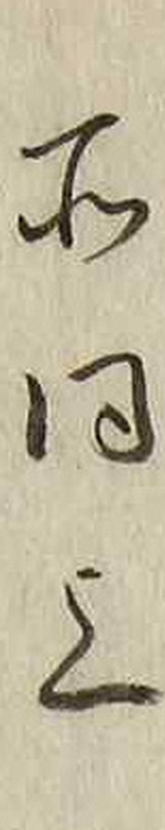所同上
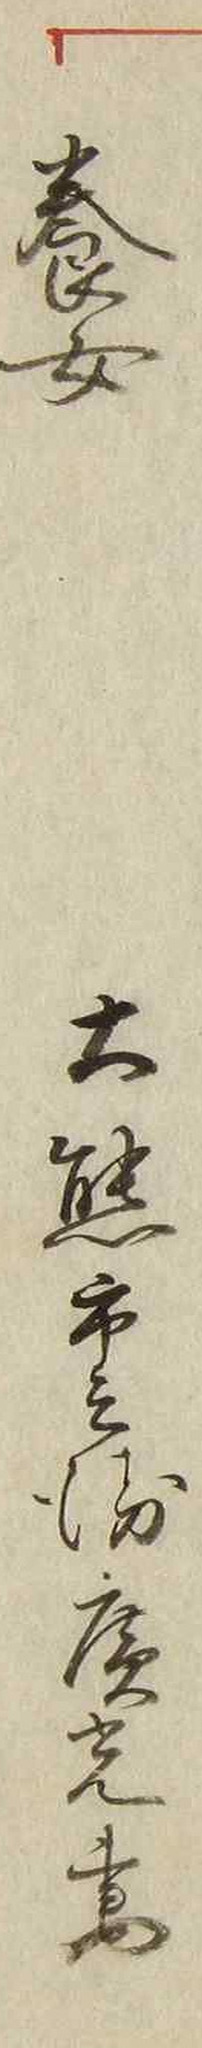養女大熊市兵衛廣光妻

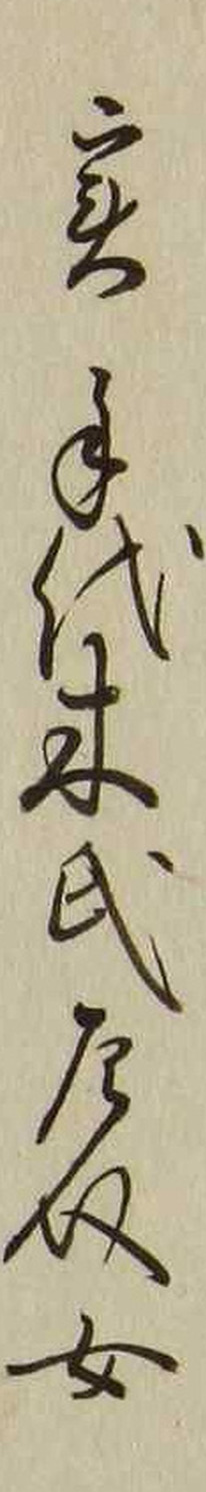実手代木氏厄介女
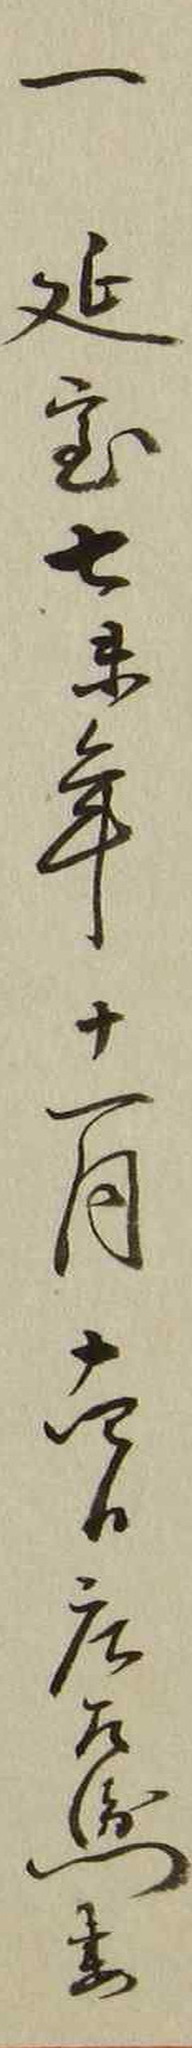一延宝七未年十一月十四日庄左衛門妻
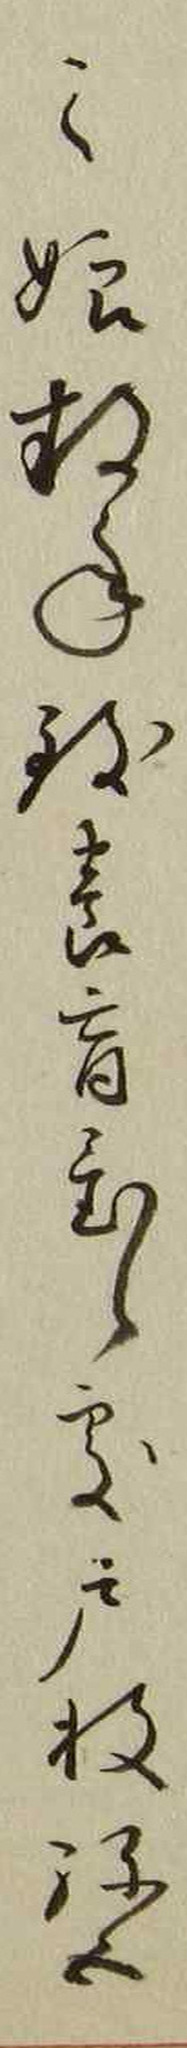之娘数年致養育置候処戸枝弥五
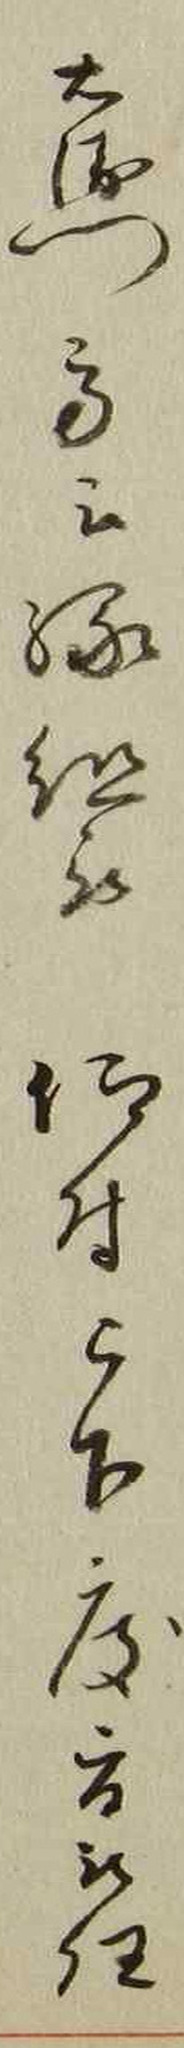右衛門方江縁組被仰付被下度旨被任
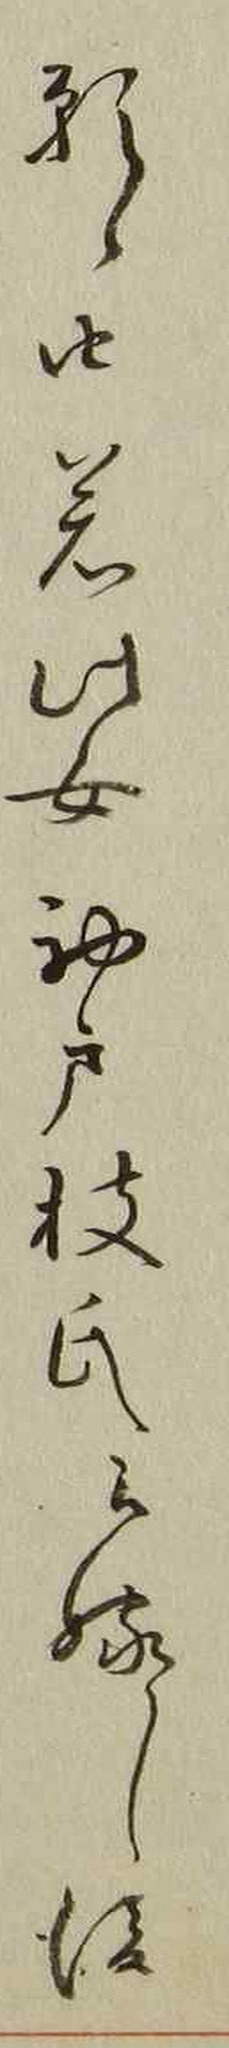願候由若此女初戸枝氏江嫁し後
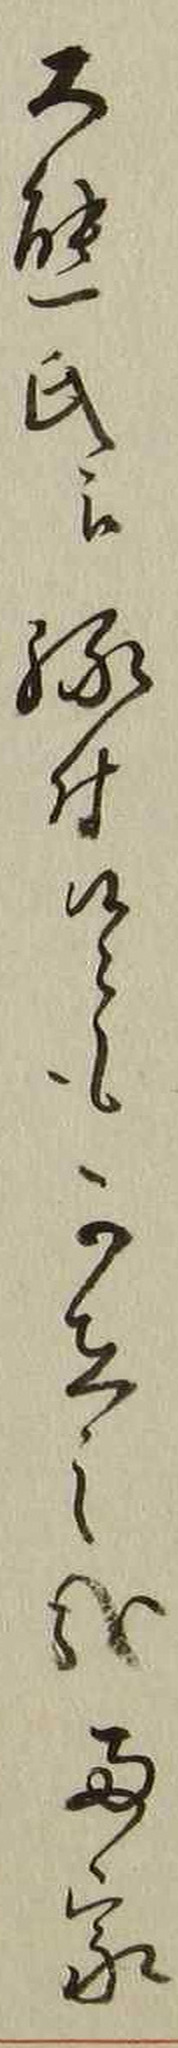大熊氏江縁付候とも可在之哉両家
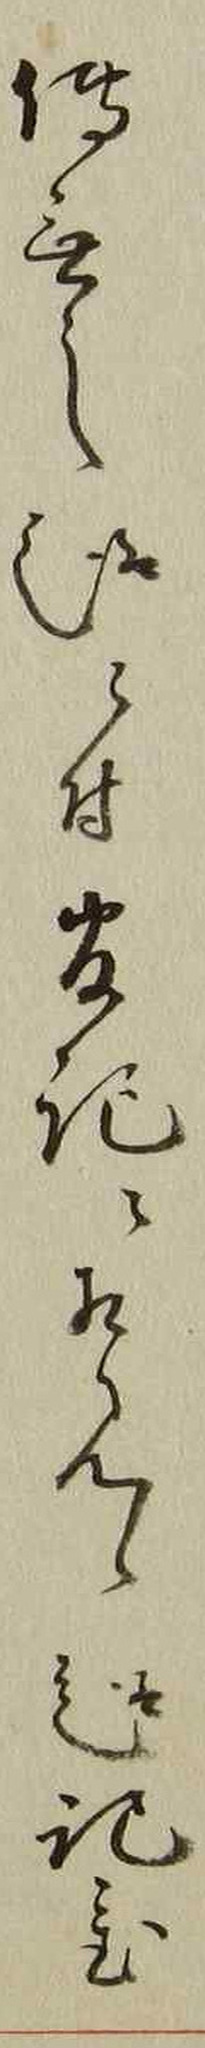伝無之趣に付官記に相見候趣記置
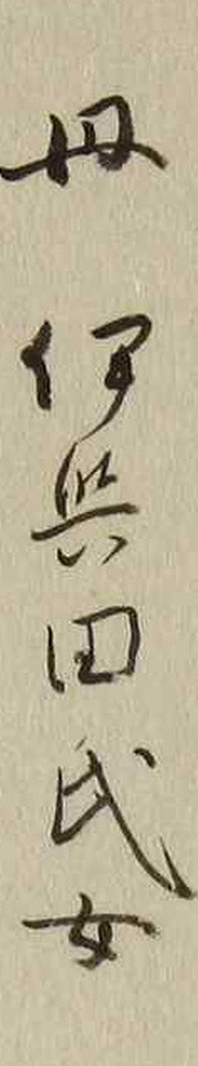母伊與田氏女
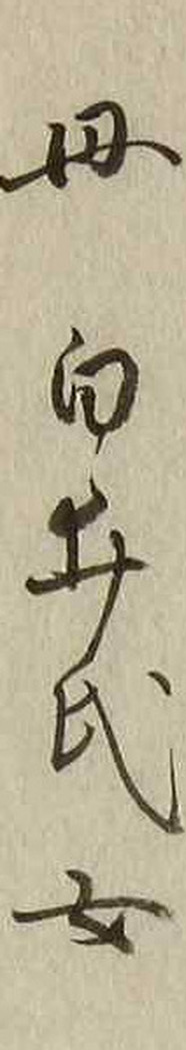母白井氏女
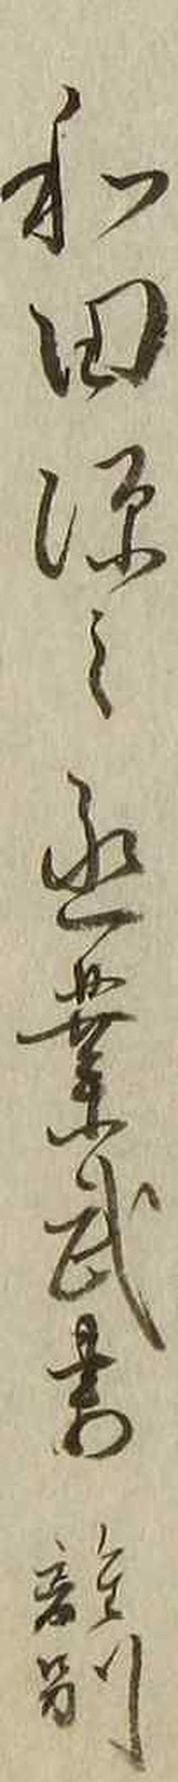和田源之丞業武妻離別
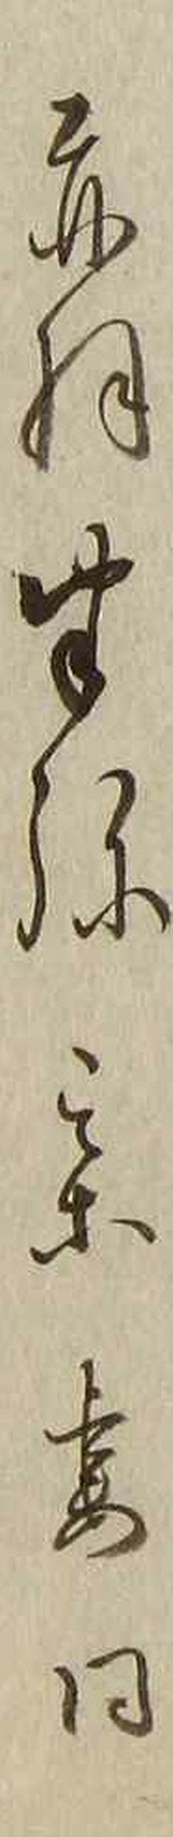女赤羽半弥某妻同
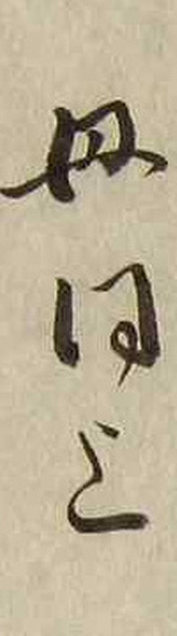母同上
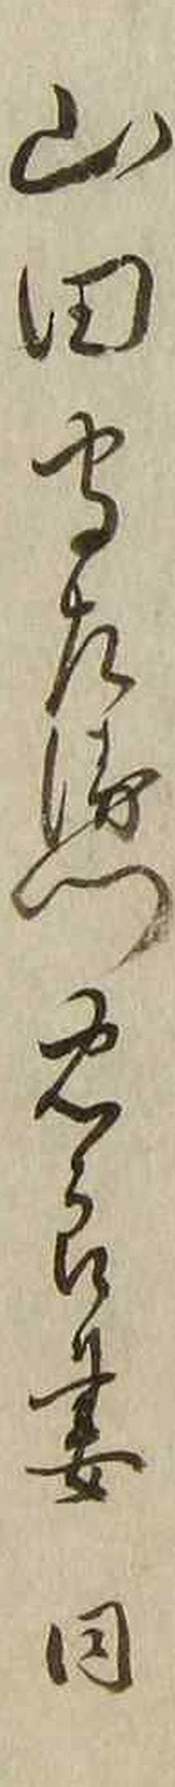山田守左衛門忠良妻同

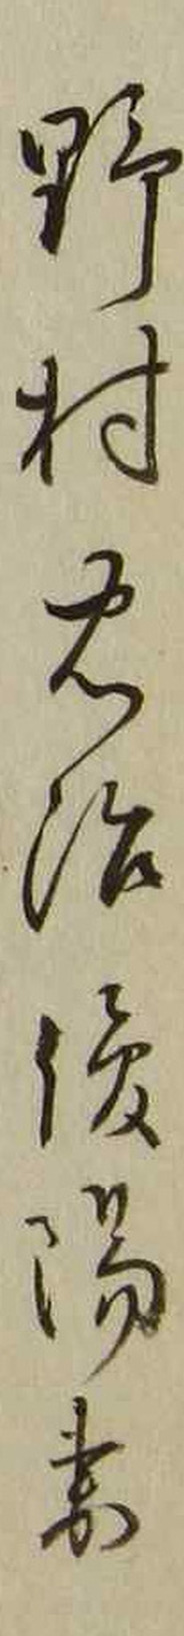女野村忠治俊陽妻
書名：諸士系譜　巻之3　い之部3
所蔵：会津若松市立会津図書館
